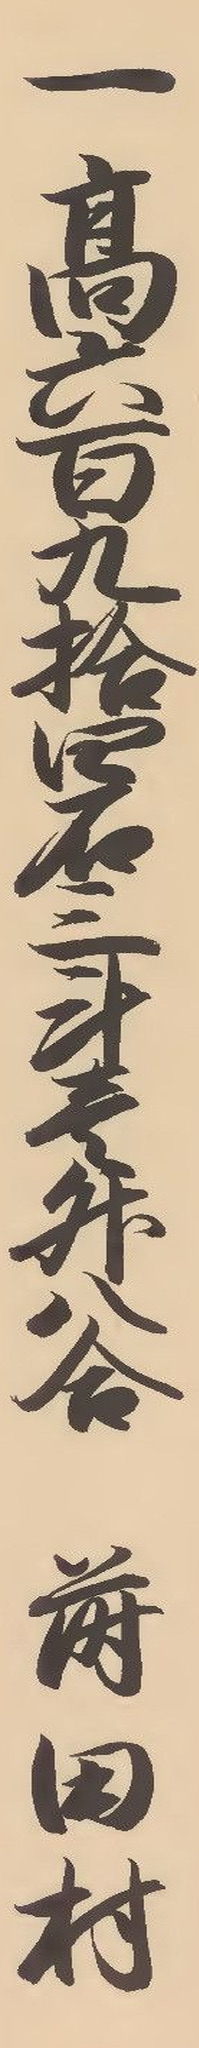一高六百九拾四石三斗壱升八合蒔田村
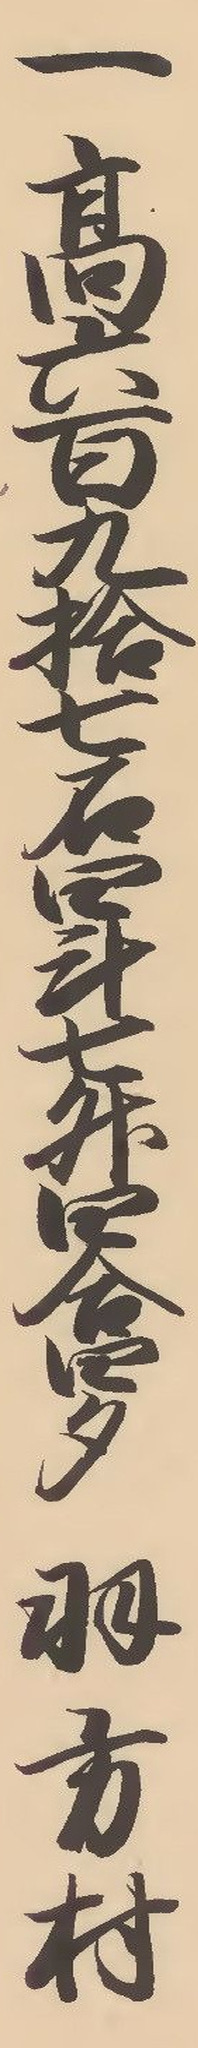一高六百九拾七石四斗七升四合四勺羽方村

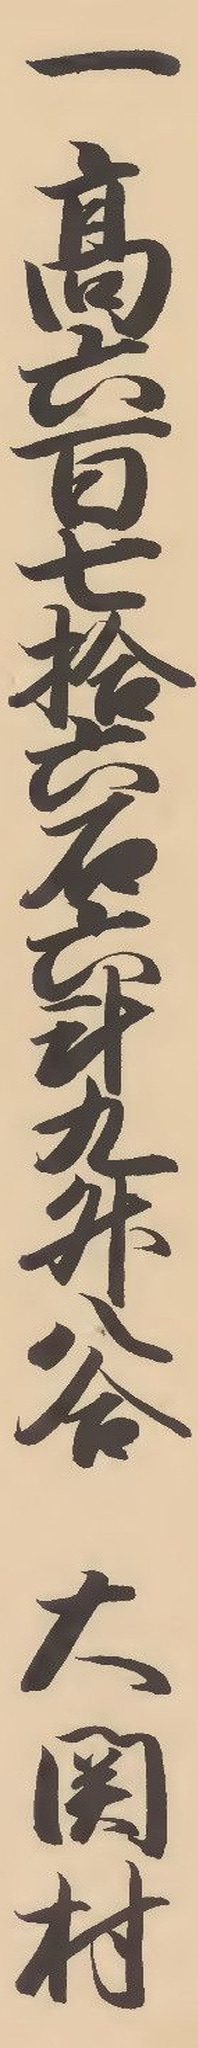一高六百七拾六石六斗九升八合大関村
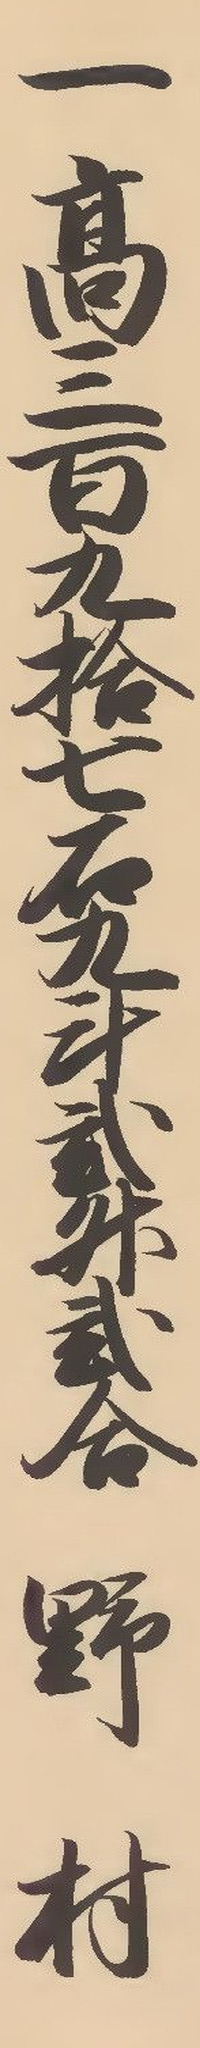一高三百九拾七石九斗弐升弐合野村
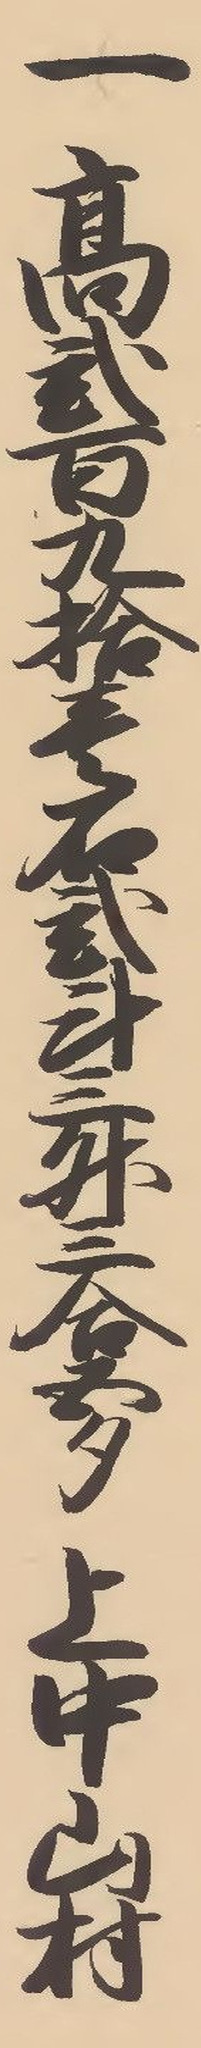一高弐百九拾壱石弐斗三升三合五勺上中山村
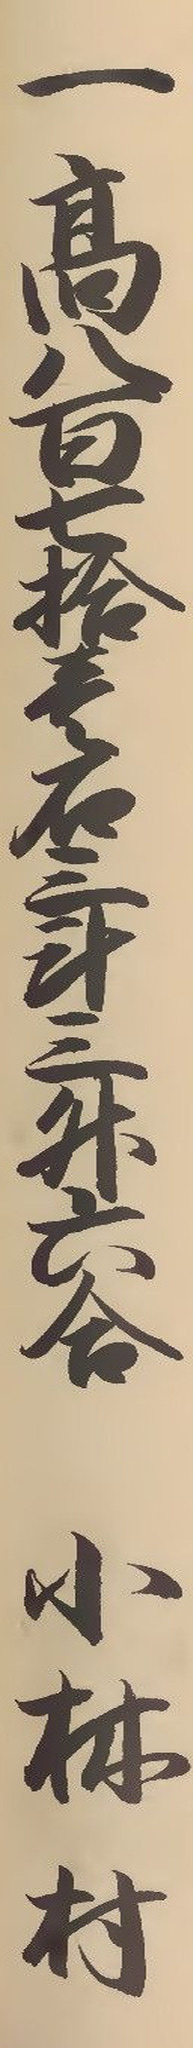一高八百七拾壱石三斗三升六合小林村
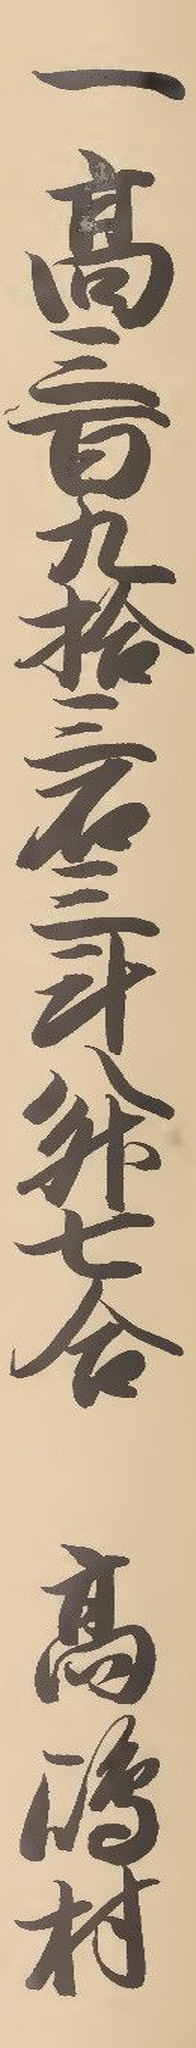一高三百九拾三石三斗八升七合高島村
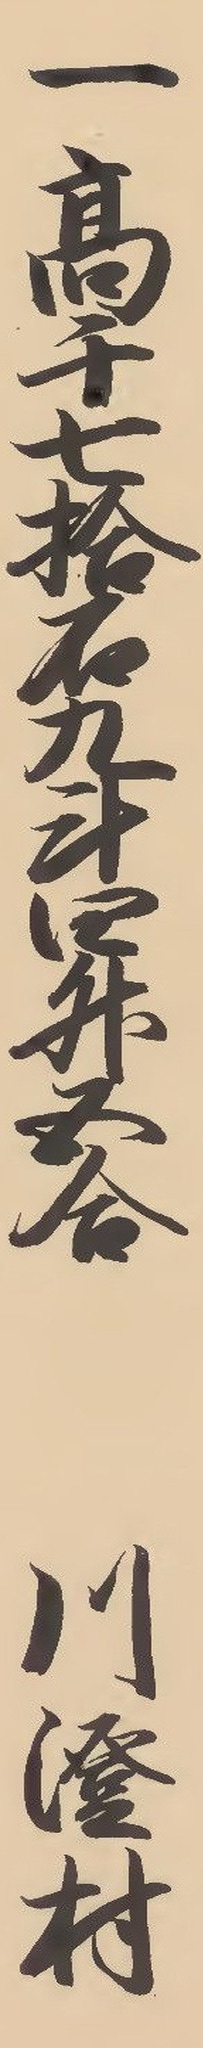一高千七拾石九斗四升五合川澄村
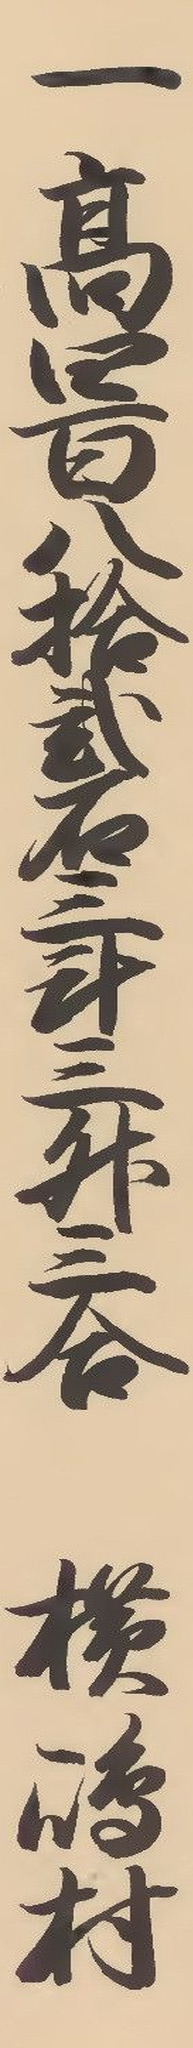一高四百八拾弐石三斗三升三合横島村
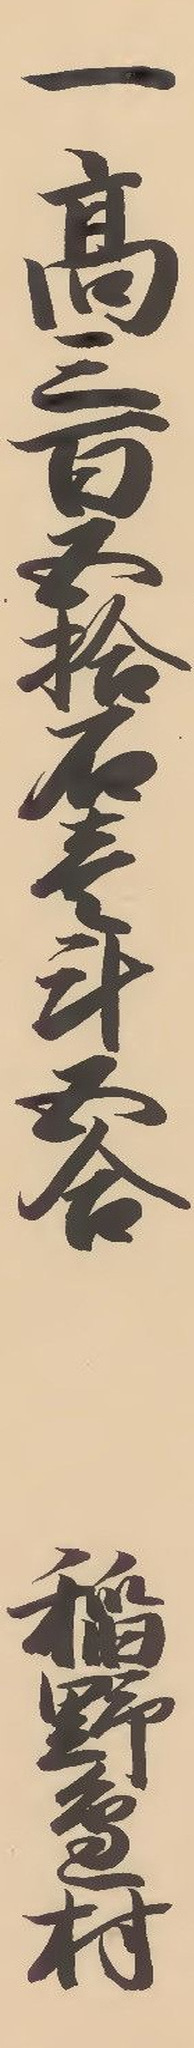一高三百五拾石壱斗五合稲野辺村

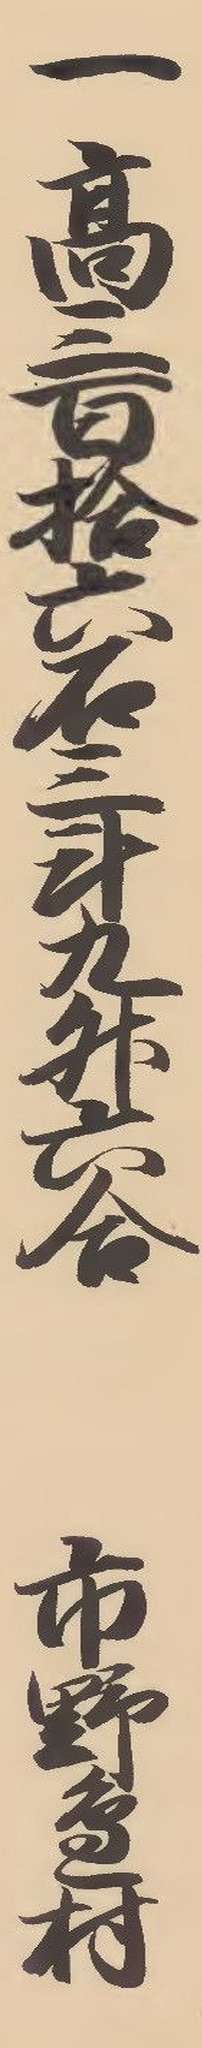一高三百拾六石三斗九升六合市野辺村
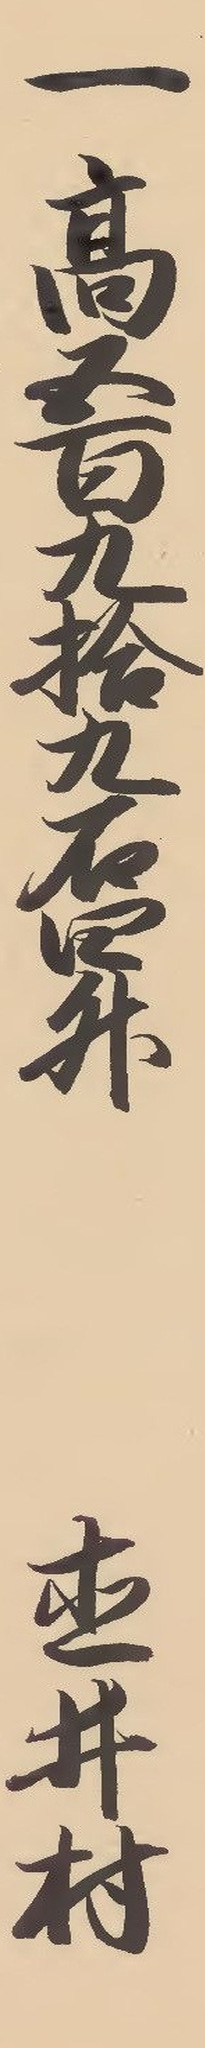一高五百九拾九石四升直井村
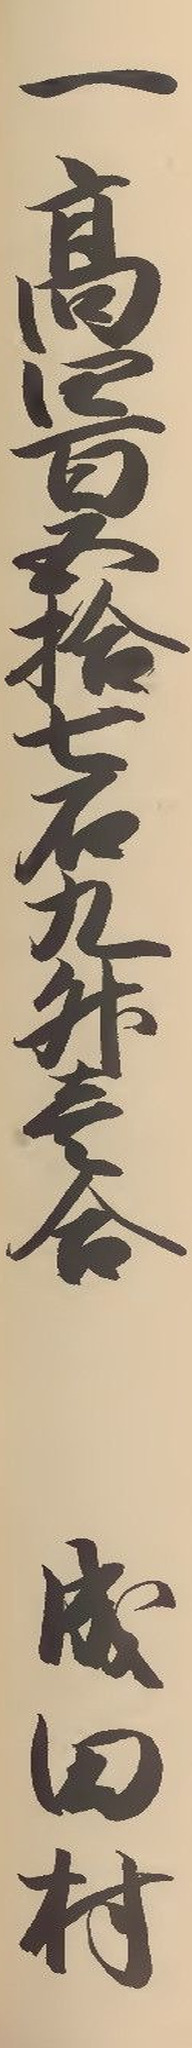一高四百五拾七石九升壱合成田村
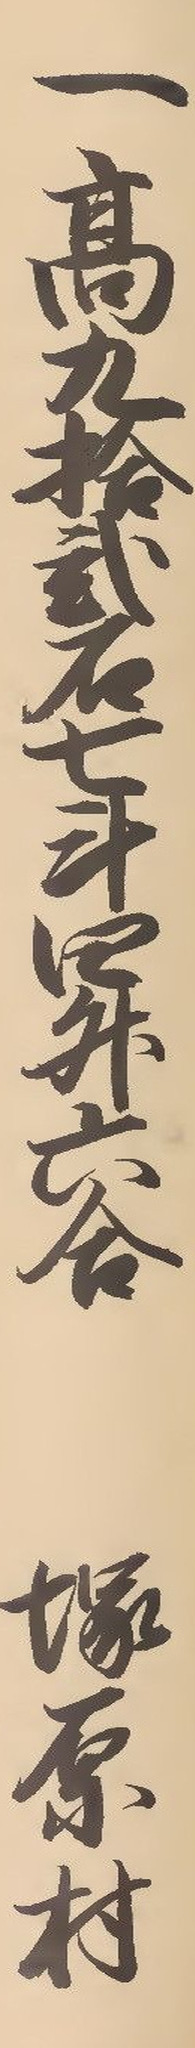一高九拾弐石七斗四升六合塚原村
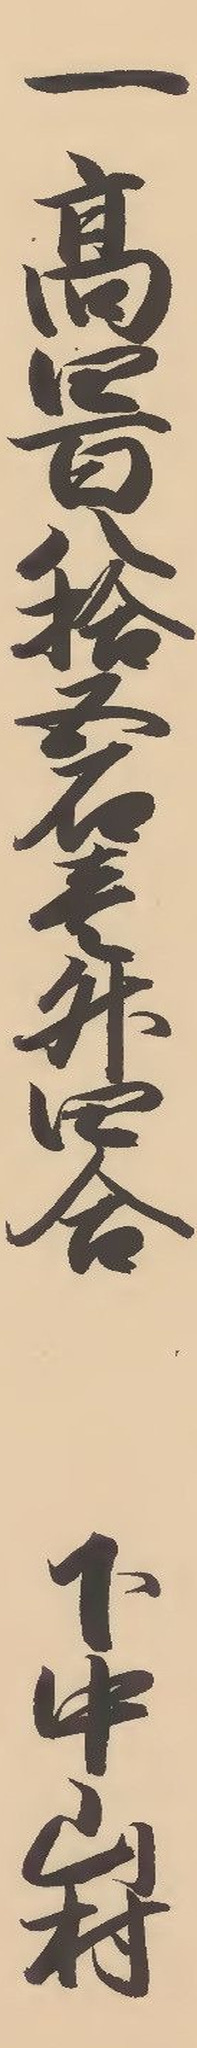一高四百八拾五石壱升四合下中山村
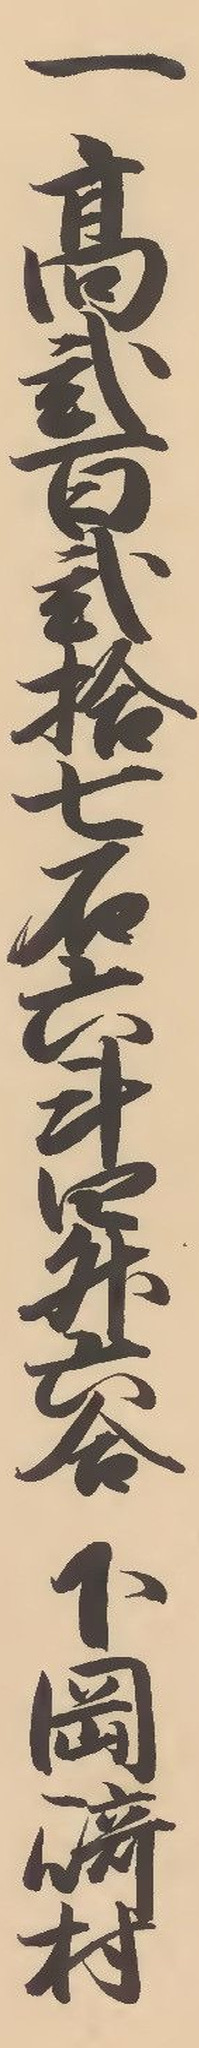一高弐百弐拾七石六斗四升六合下岡崎村
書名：常陸国郷帳
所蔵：国立公文書館 National Archives of Japan
